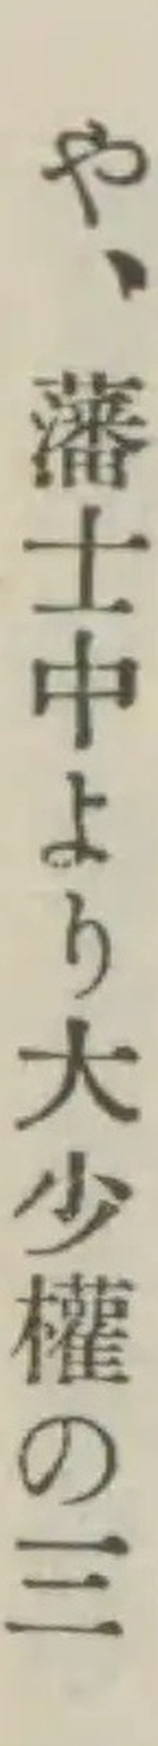や、藩士中より大少権の三
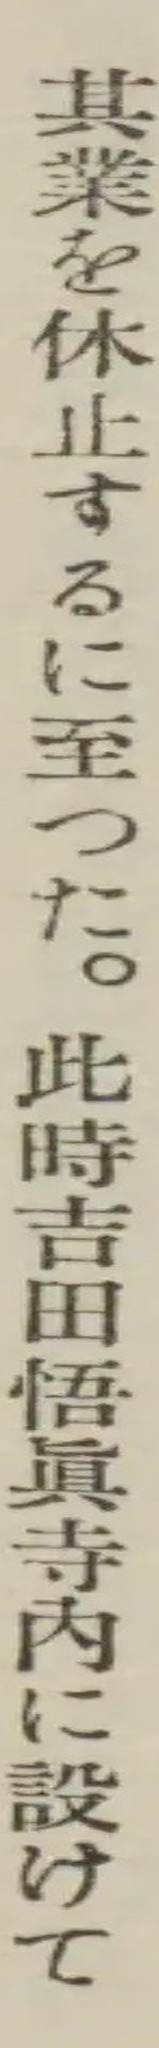其業を休止するに至つた。此時吉田悟眞寺内に設けて
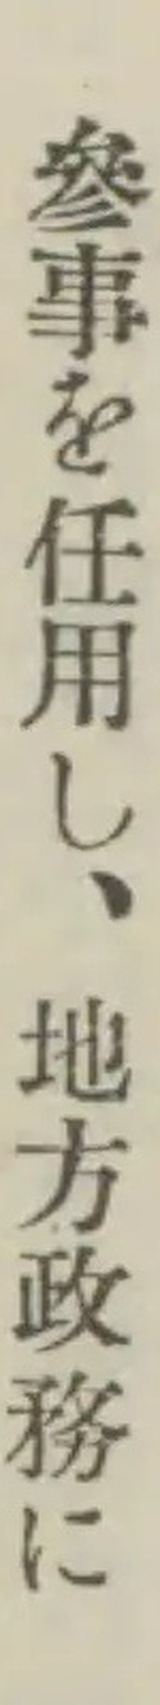参事を任用し、地方政務に
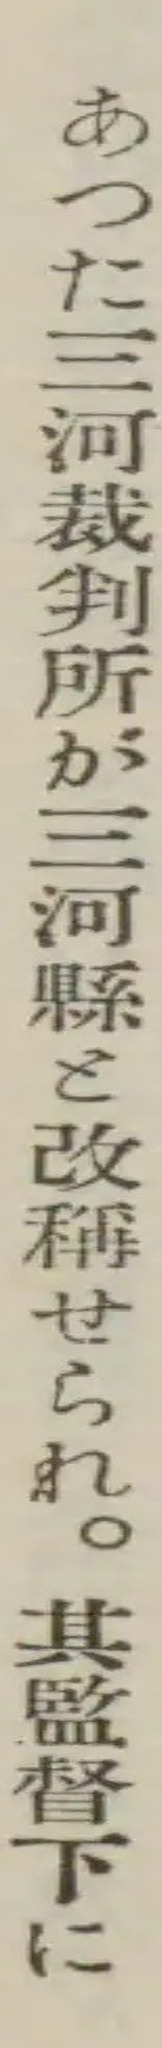あつた三河裁判所が三河県と改称せられ。其監督下に
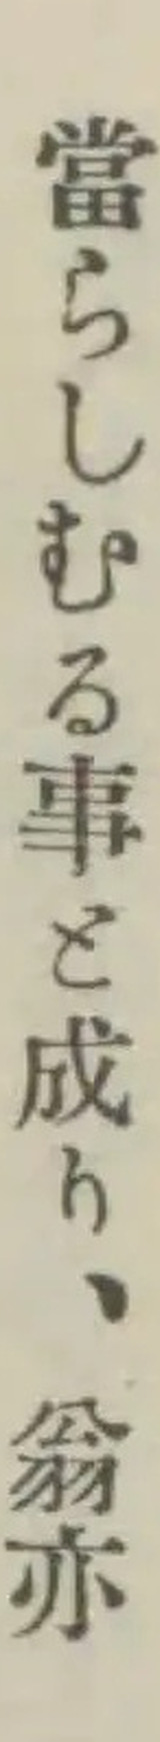当らしむる事と成り、翁亦
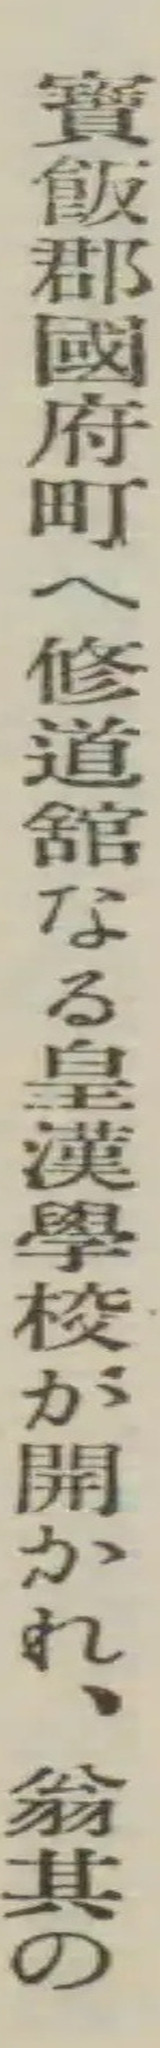寶飯郡国府町へ修道館なる皇漢学校が開かれ、翁其の
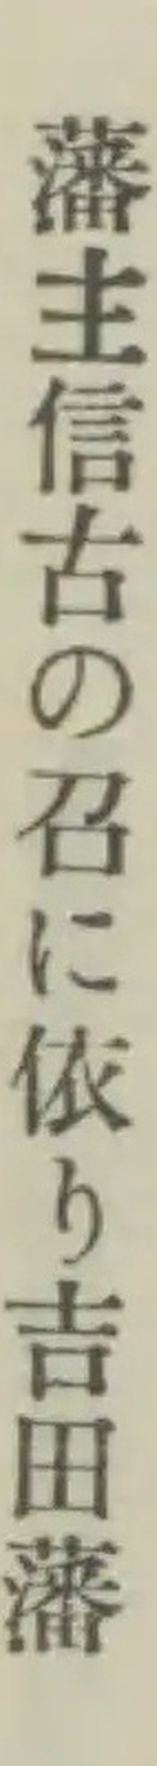藩主信古の召に依り吉田藩
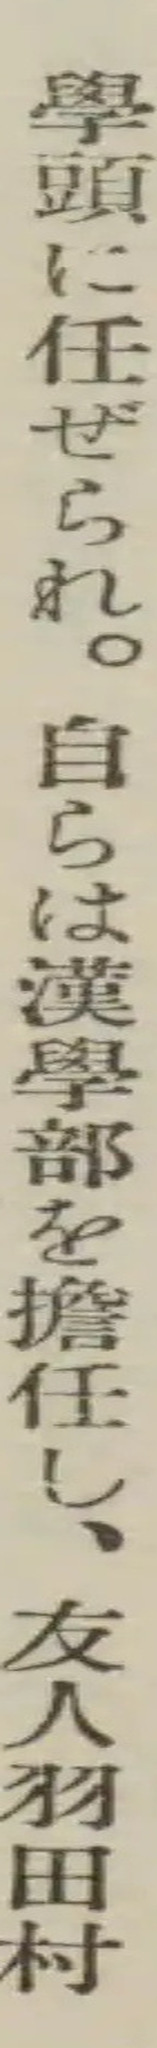学頭に任ぜられ。自らは漢学部を擔任し、友人羽田村
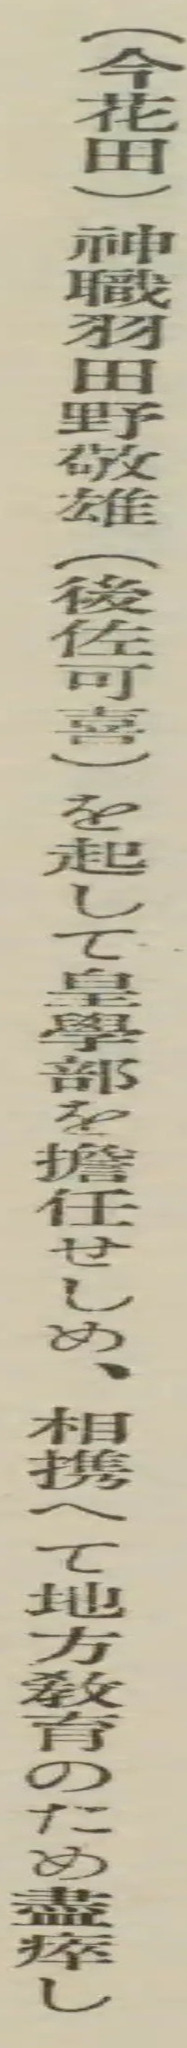(今花田)神職羽田野敬雄(後佐可喜)を起して皇学部を擔任せしめ、相携へて地方教育のため尽瘁し
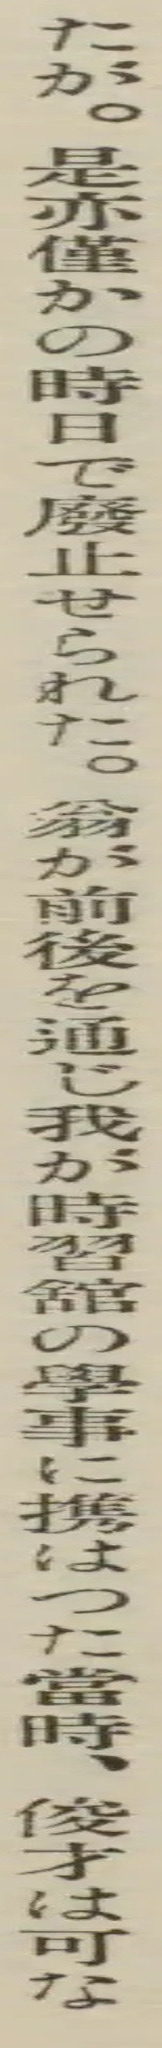たが。是亦僅かの時日で廃止せられた。翁が前後を通じ我が時習館の学事に携はつた当時、俊才は可な
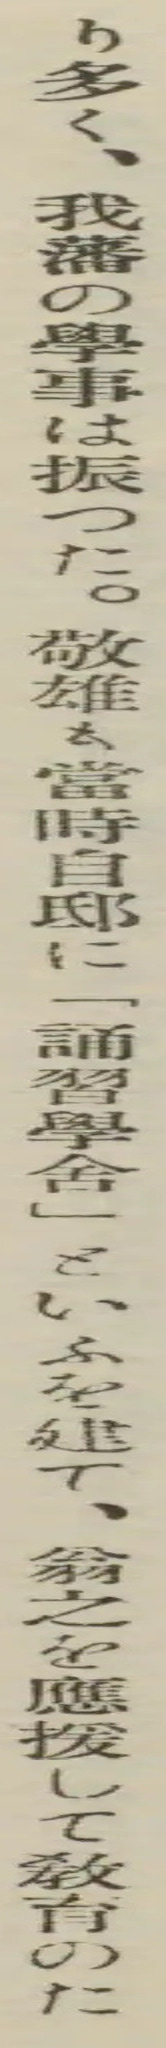り多く、我藩の学事は振つた。敬雄も当時自邸に「誦習学舎」といふを建て、翁之を応援して教育のた
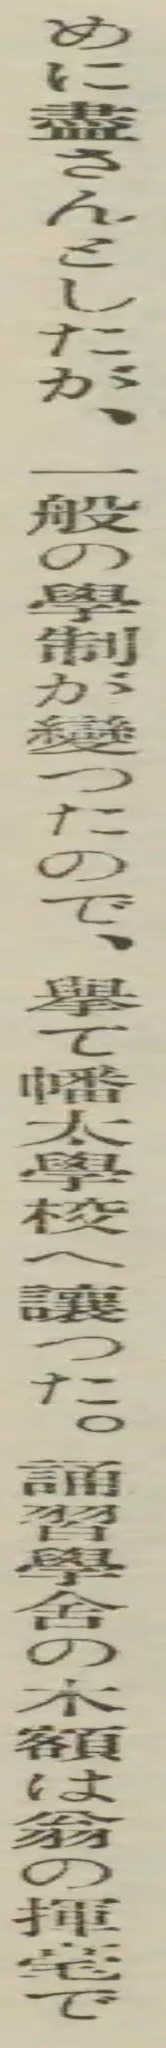めに尽さんとしたが、一般の学制が変つたので、挙て幡太学校へ譲つた。誦習学舎の木額は翁の揮毫で
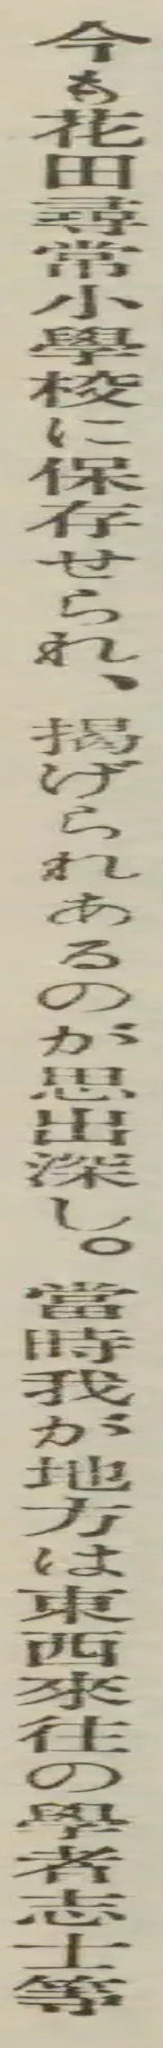今も花田尋常小学校に保存せられ、掲げられあるのが思出深し。当時我が地方は東西来往の学者志士等
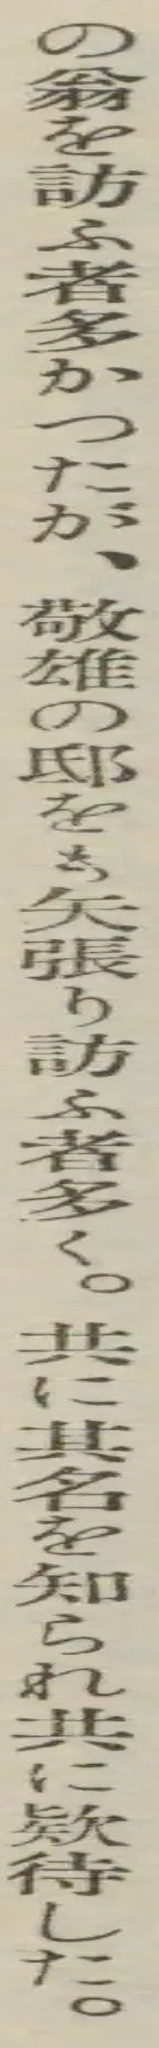の翁を訪ふ者多かつたが、敬雄の邸をも矢張り訪ふ者多く。共に其名を知られ共に欵待した。
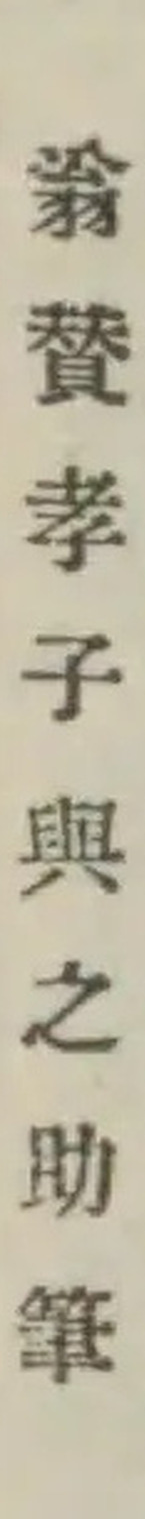翁賛孝子與之助筆
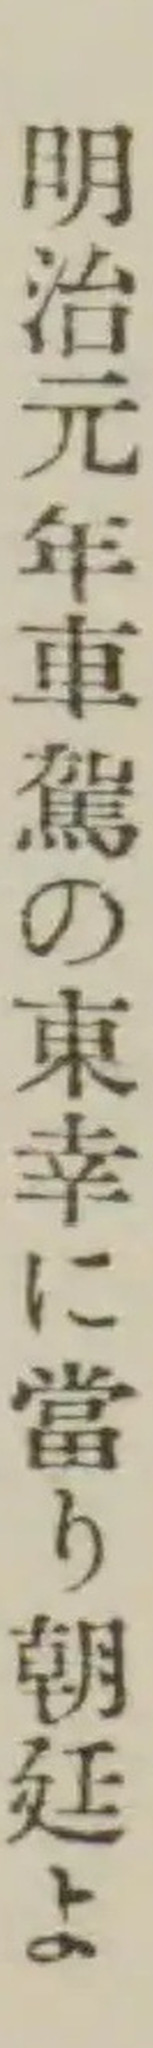明治元年車駕の東幸に当り朝廷よ
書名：小野湖山翁小伝
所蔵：国立国会図書館 National Diet Library, JAPAN
